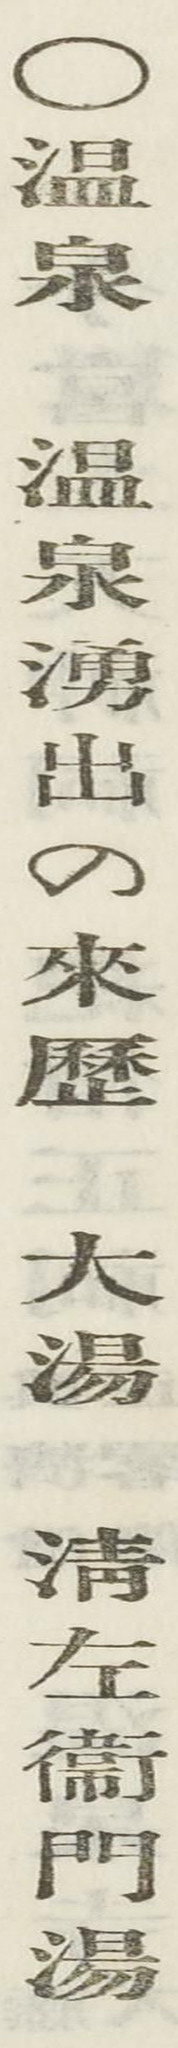〇温泉温泉湧出の来歴大湯清左衛門湯
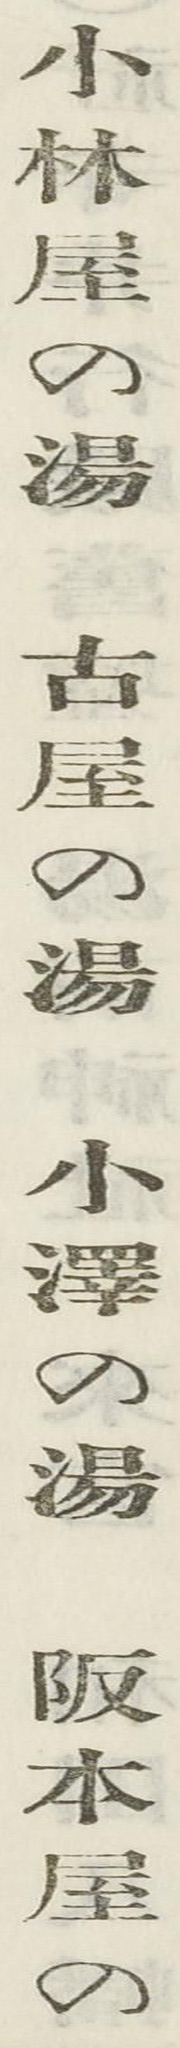小林屋の湯古屋の湯小澤の湯阪本屋の
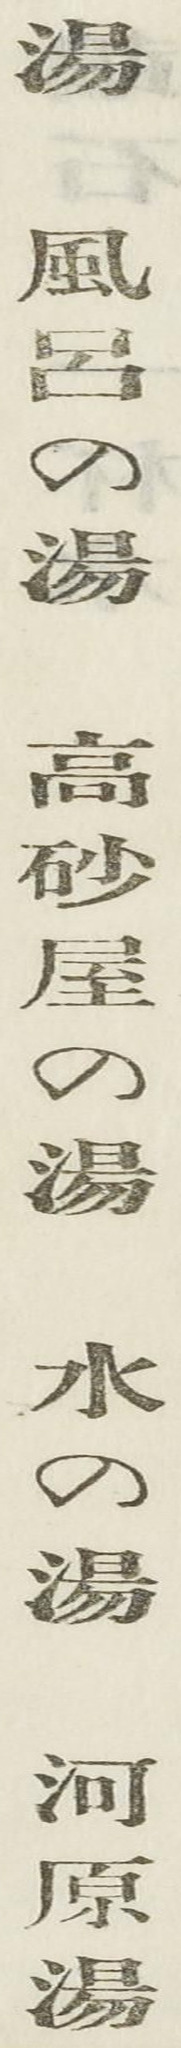湯風呂の湯高砂屋の湯水の湯河原湯
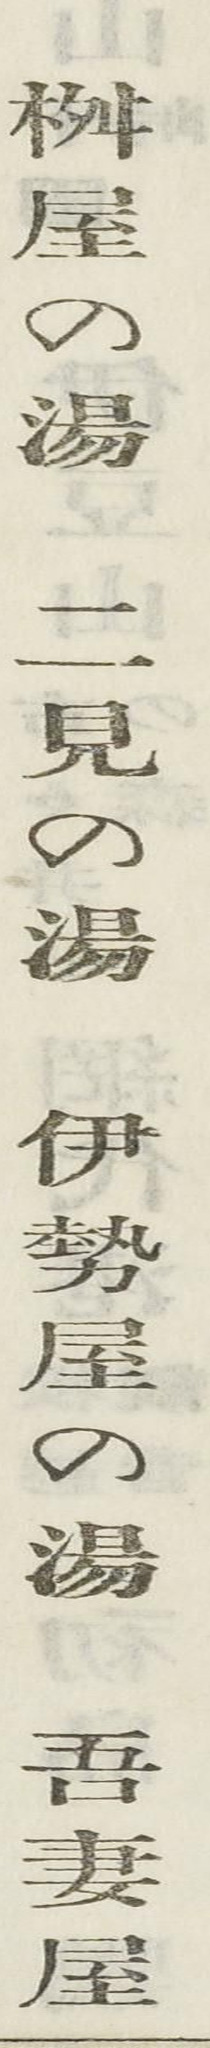桝屋の湯二見の湯伊勢屋の湯吾妻屋
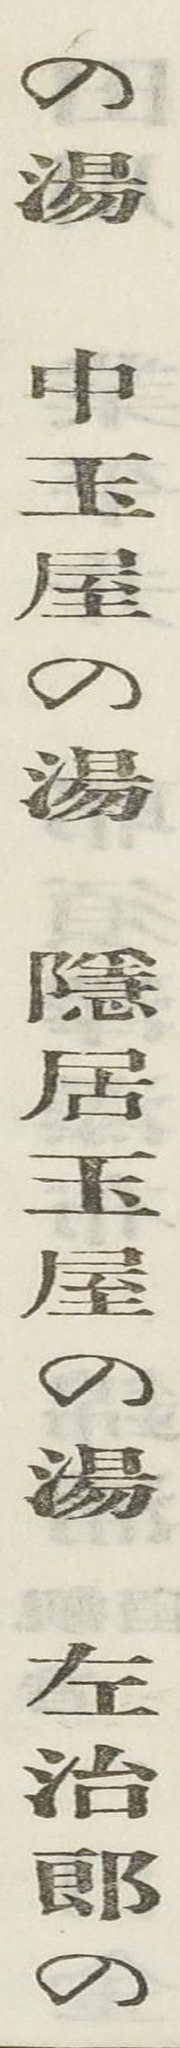の湯中玉屋の湯隠居玉屋の湯左治郎の
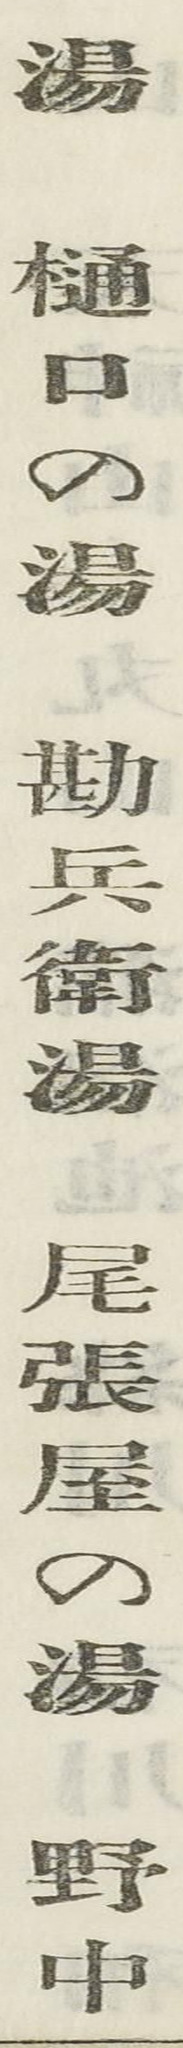湯樋口の湯勘兵衛湯尾張屋の湯野中
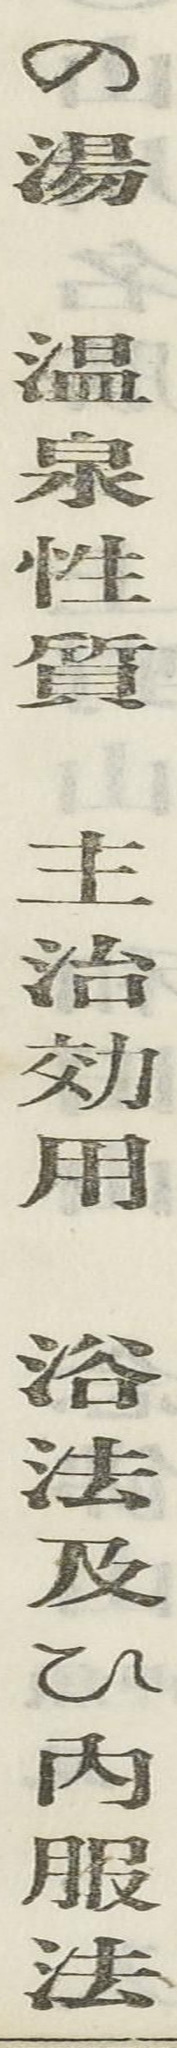の湯温泉性質主治効用浴法及ひ内服法
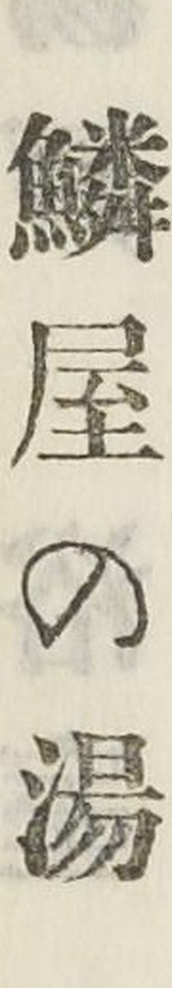鱗屋の湯

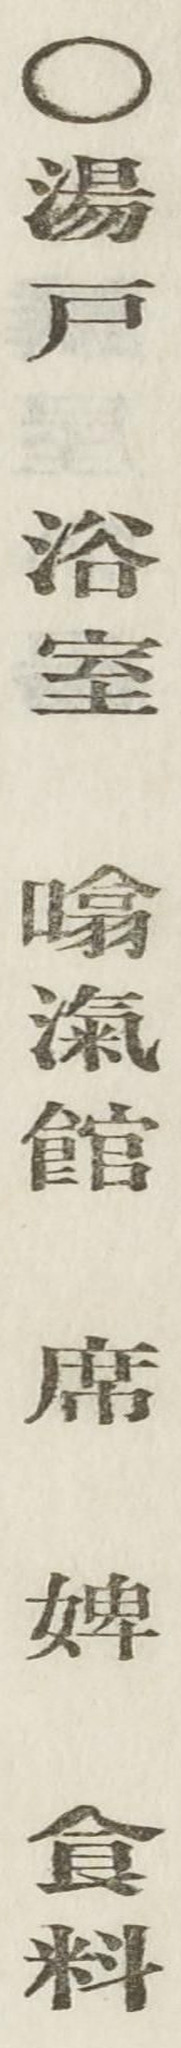〇湯戸浴室噏滊館席婢食料
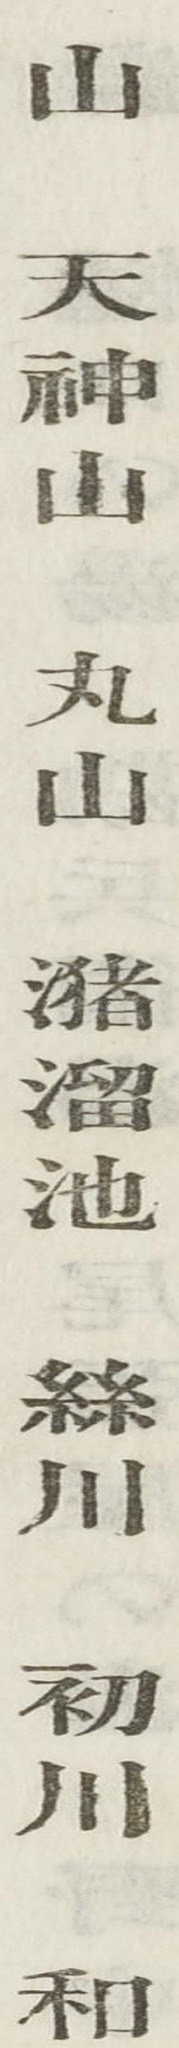山天神山丸山瀦溜池絲川初川和
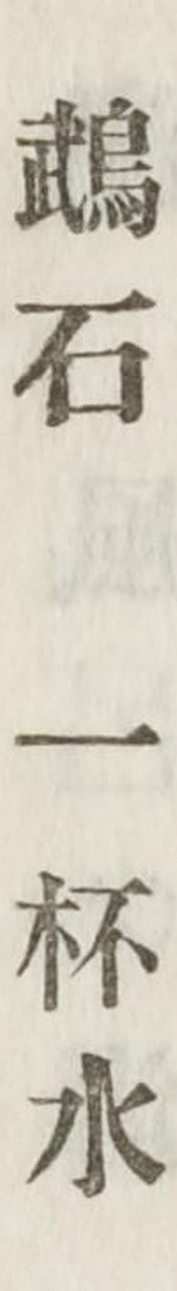鵡石一杯水
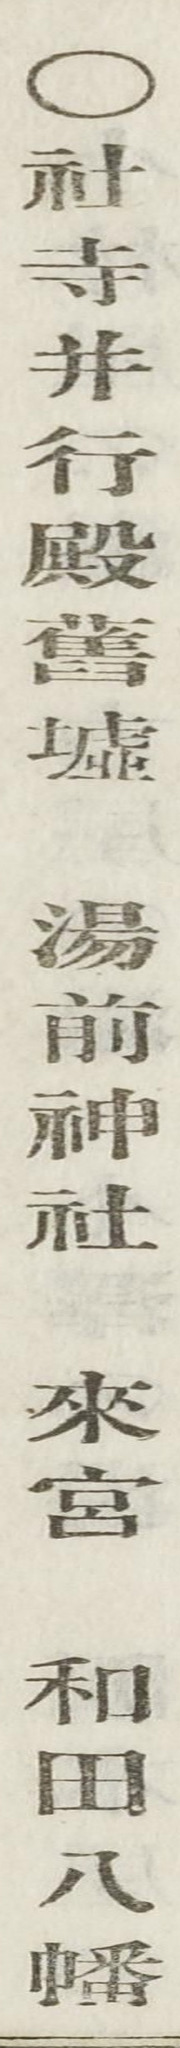〇社寺并行殿旧墟湯前神社來宮和田八幡
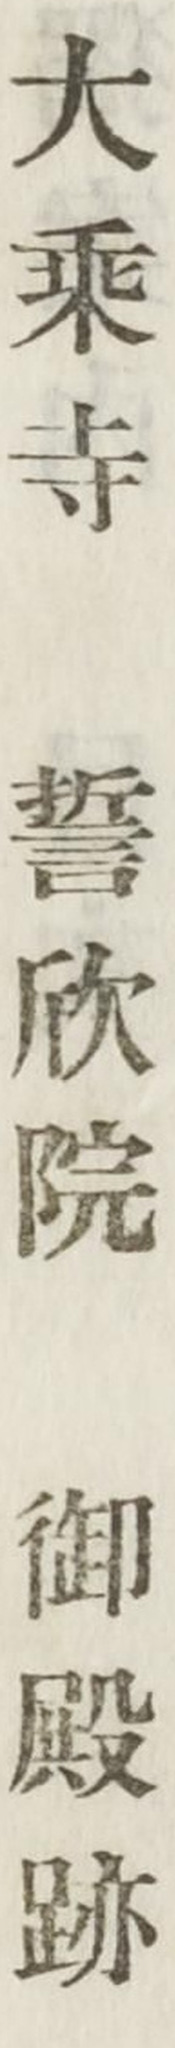大乗寺誓欣院御殿跡
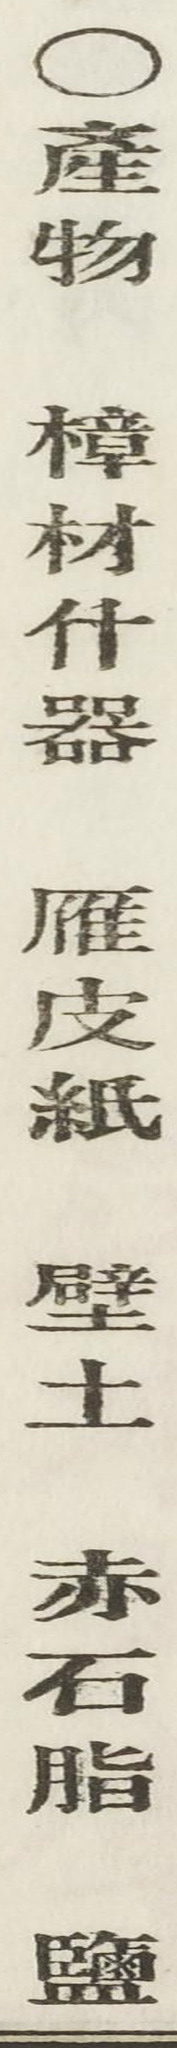〇産物樟材什器雁皮紙壁土赤石脂鹽
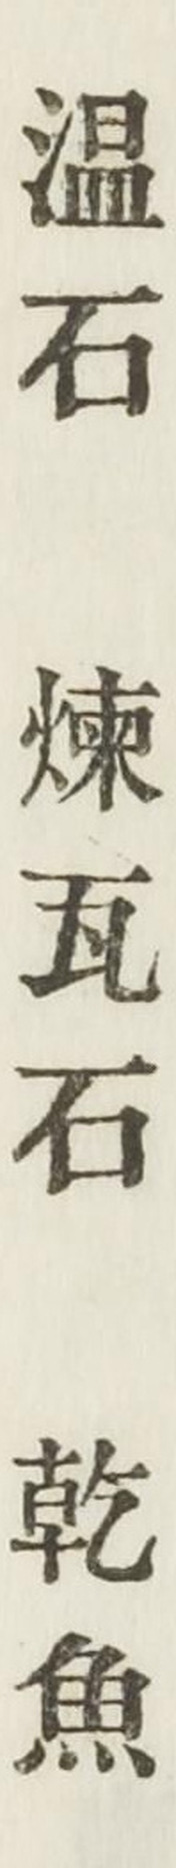温石煉瓦石乾魚

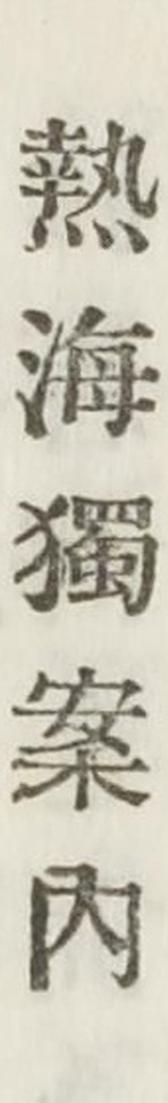熱海獨案内
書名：熱海獨案内　全
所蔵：東京大学地震研究所図書室 Earthquake Research Institute Library, The University of Tokyo, JAPAN
